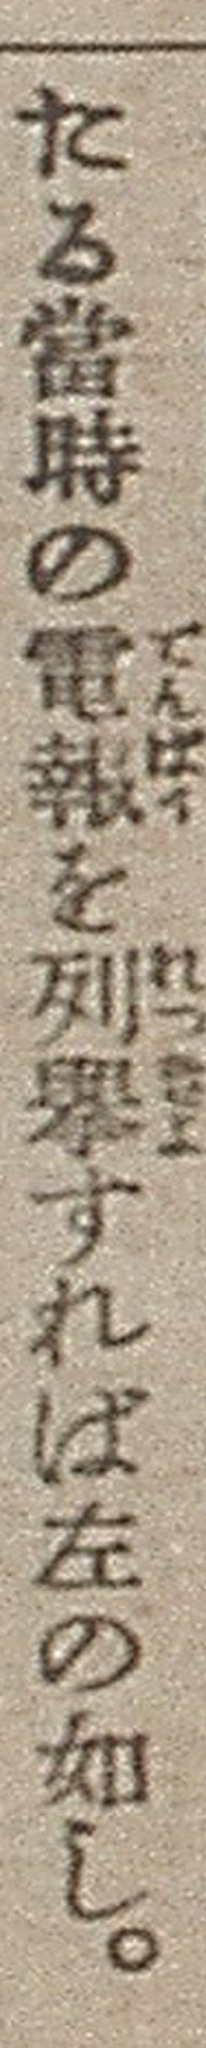たる当時の電報を列挙すれば左の如し。
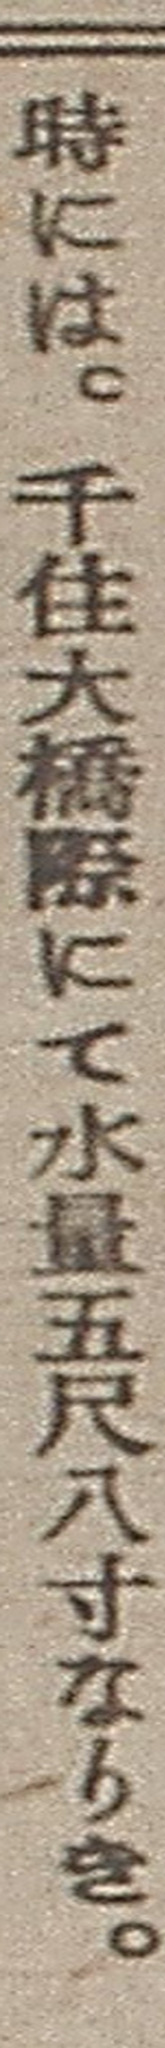時には。千住大橋際にて水量五尺八寸なりき。
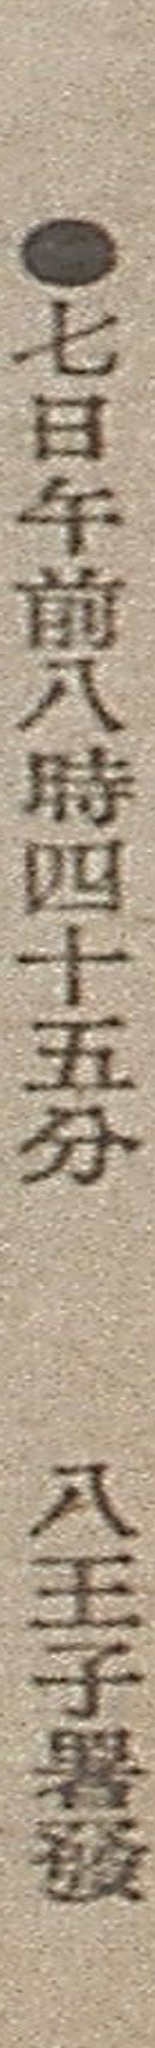●七日午前八時四十五分八王子署発
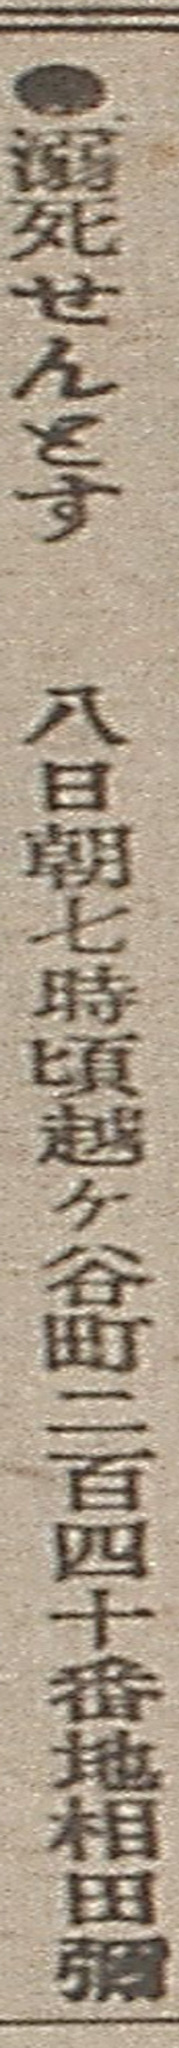●溺死せんとす八日朝七時頃越ケ谷町二百四十番地相田彌
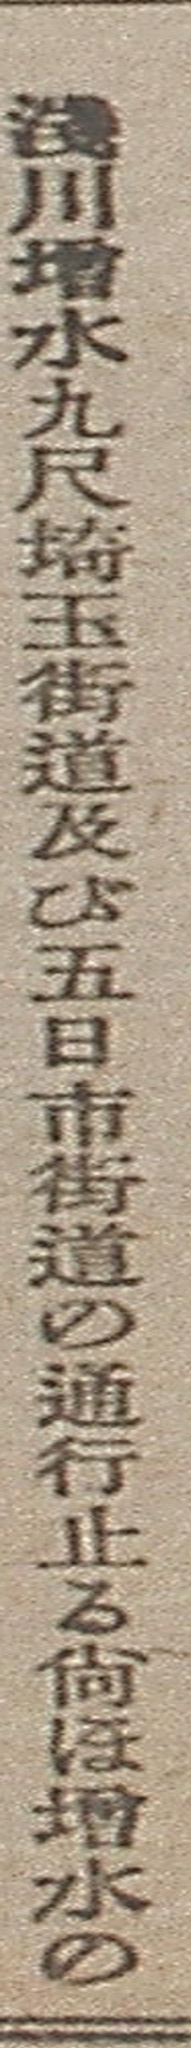浅川増水九尺埼玉街道及び五日市街道の通行止る尚ほ増水の
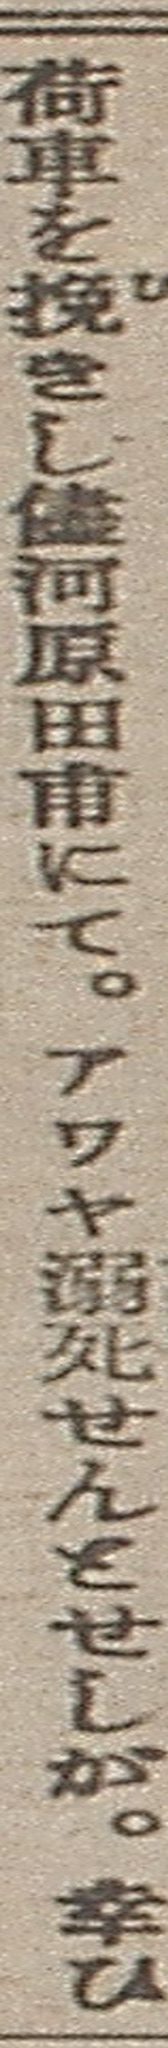荷車を挽きし侭河原田甫にて。アワヤ溺死せんとせしが。幸ひ
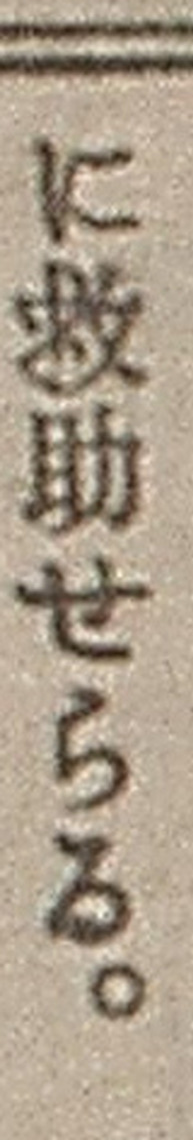に救助せらる。
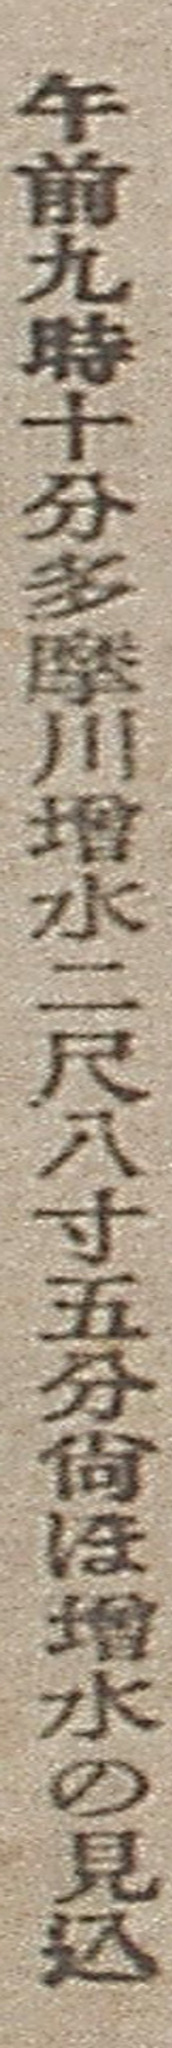午前九時十分多摩川増水二尺八寸五分尚ほ増水の見込
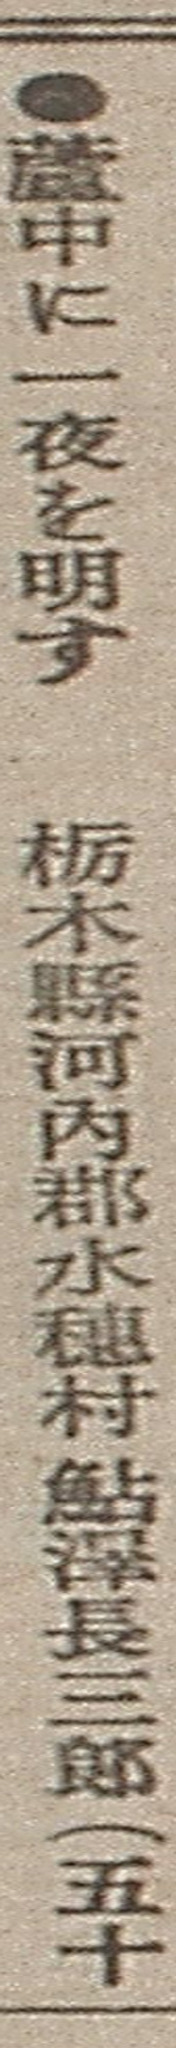●蘆中に一夜を明す栃木県河内郡水穂村鮎澤長三郎（五十
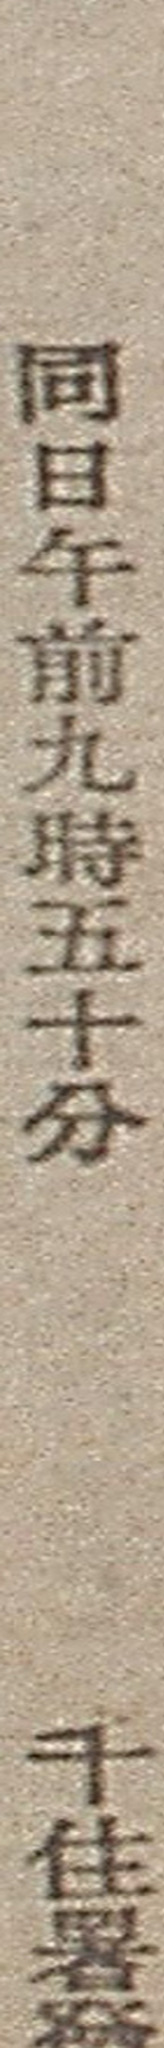同日午前九時五十分千住署発
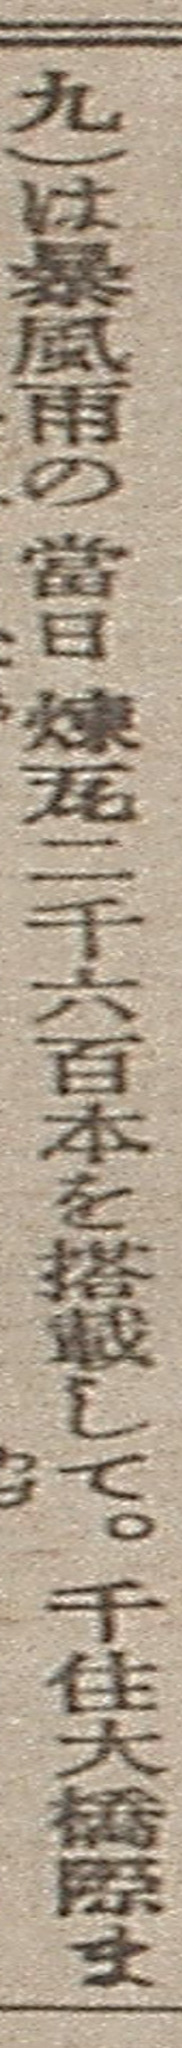九）は暴風雨の当日煉瓦二千六百本を搭載して。千住大橋際ま
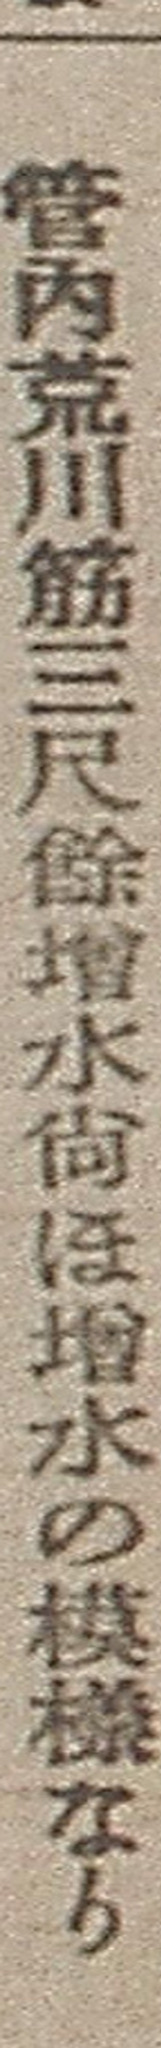管内荒川筋三尺余増水尚ほ増水の模様なり
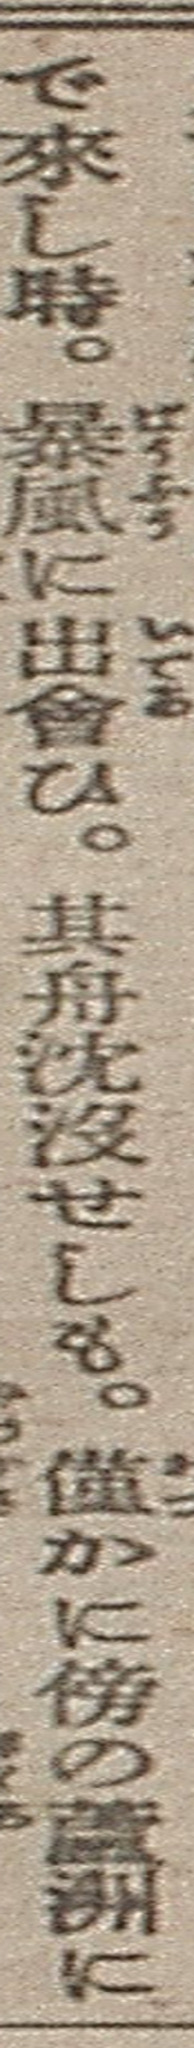で来し時。暴風に出会ひ。其舟沈没せしも。僅かに傍の蘆洲に
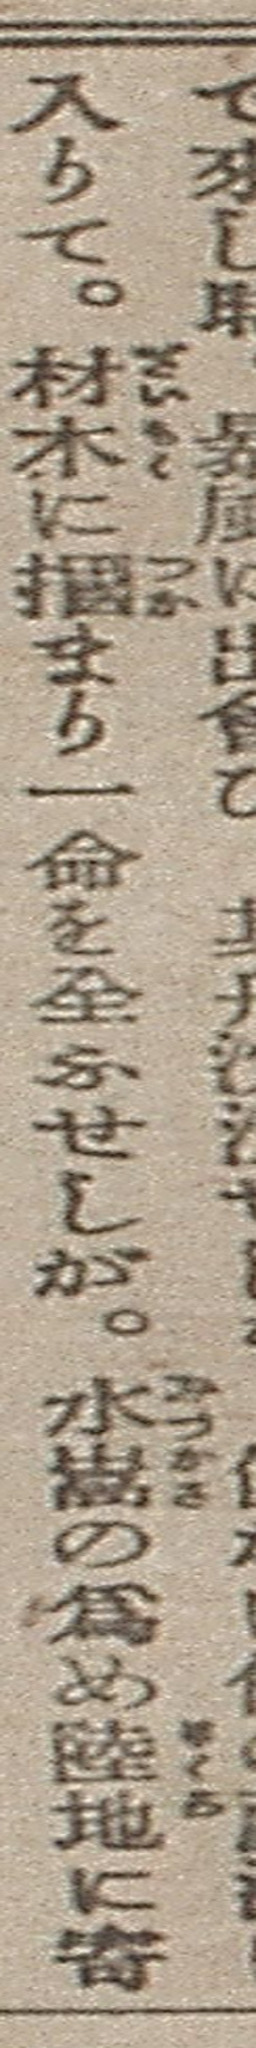入りて。材木に掴まり一命を全ふせしが。水嵩の為め陸地に寄
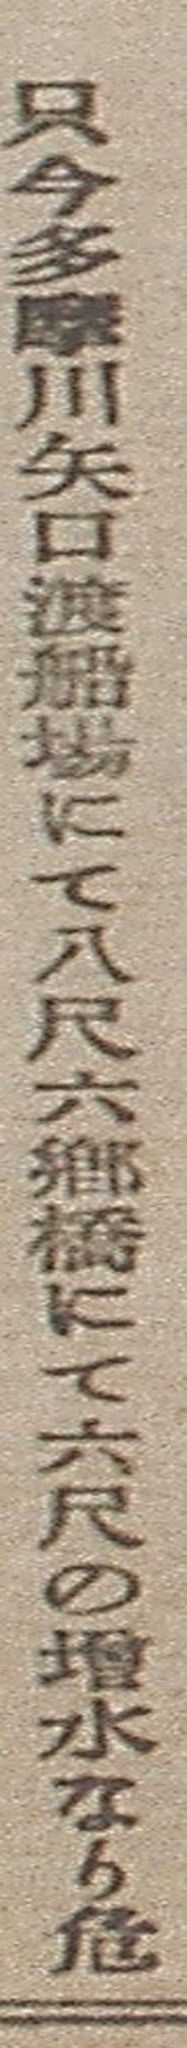只今多摩川矢口渡船場にて八尺六郷橋にて六尺の増水なり危
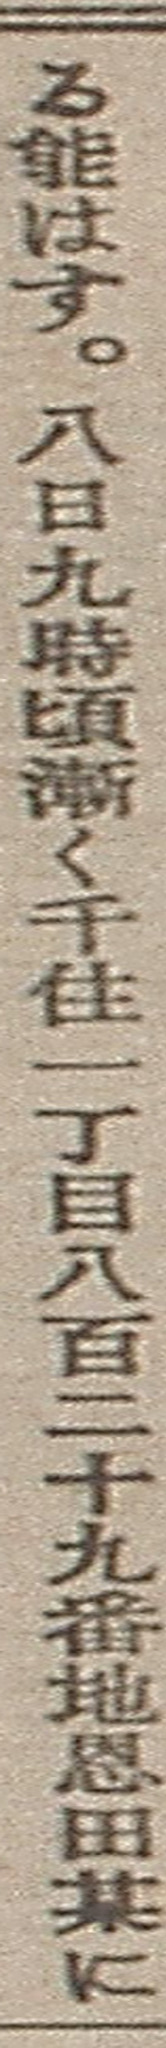る能はず。八日九時頃漸く千住一丁目八百二十九番地恩田某に
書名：風俗畫報臨時増刊第百九十九號　明治三十二年十月各地災害圖會（前編之續）
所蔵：東京大学地震研究所図書室 Earthquake Research Institute Library, The University of Tokyo, JAPAN
